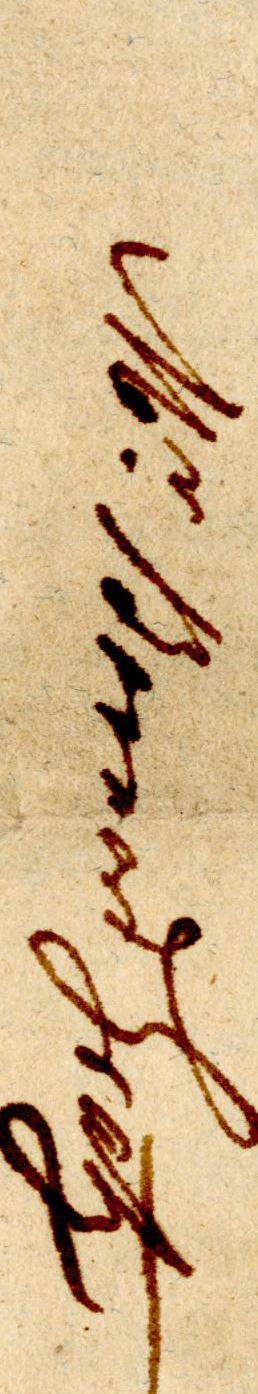M^r Barnard Gratz
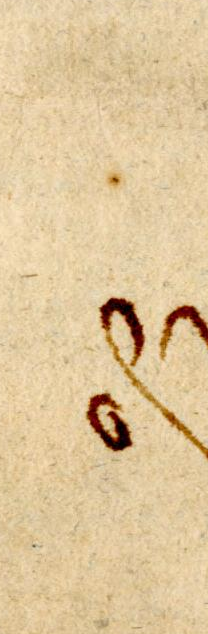To
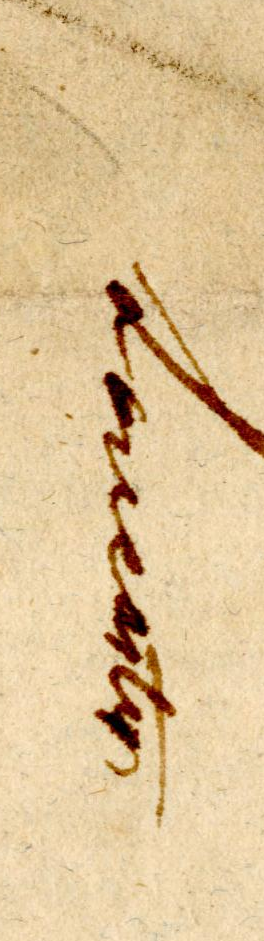Lancaster
